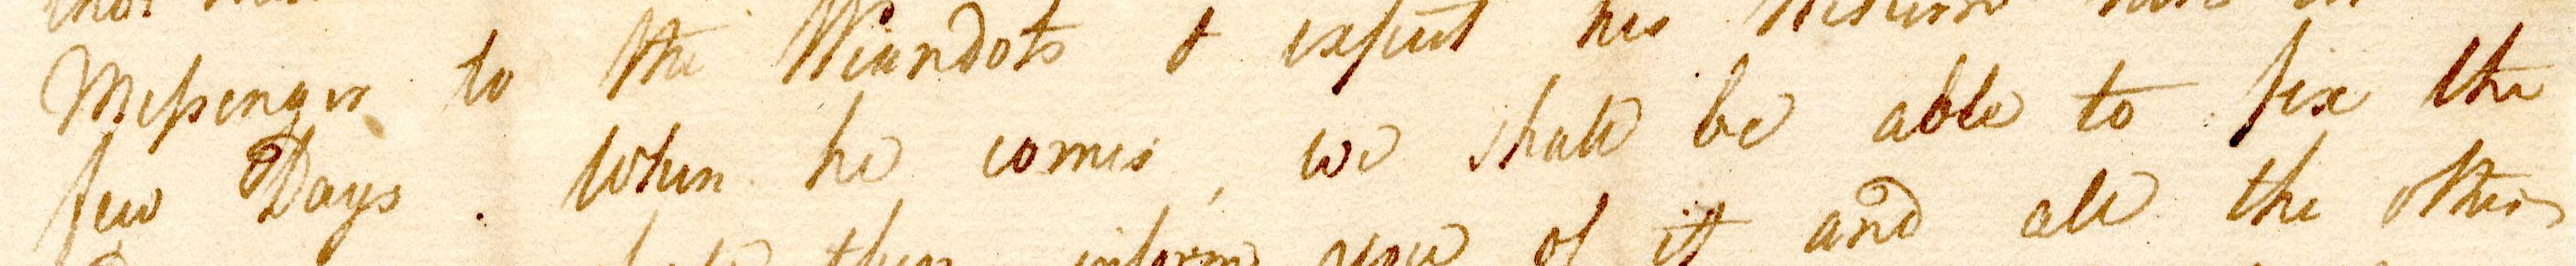few Days. When he comes we shall be able to fix the
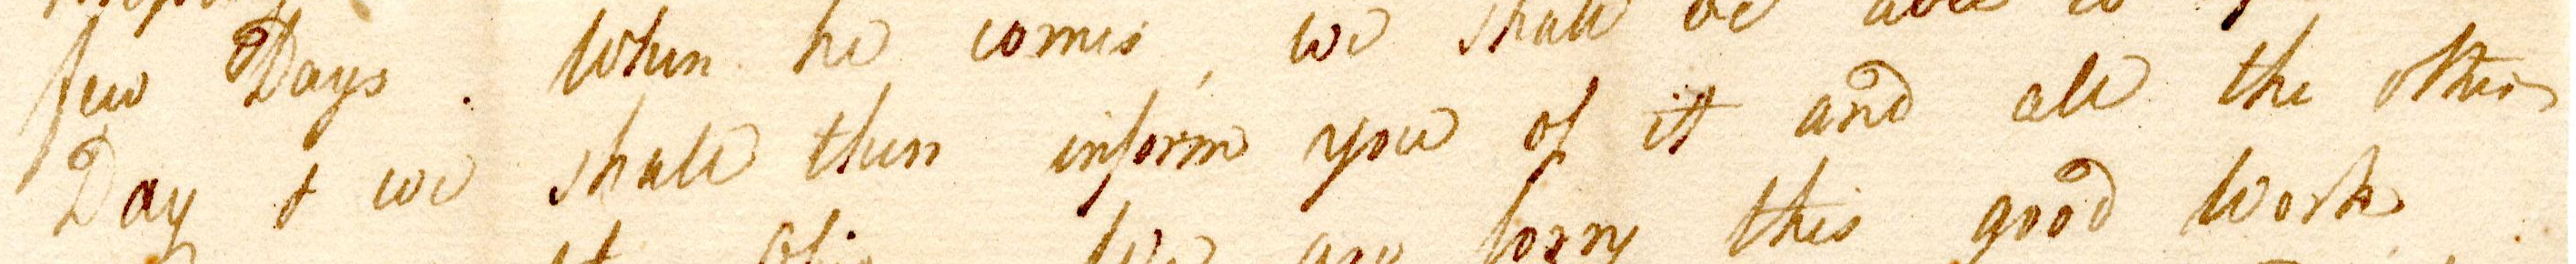Day & we shall then inform you of it and all the other
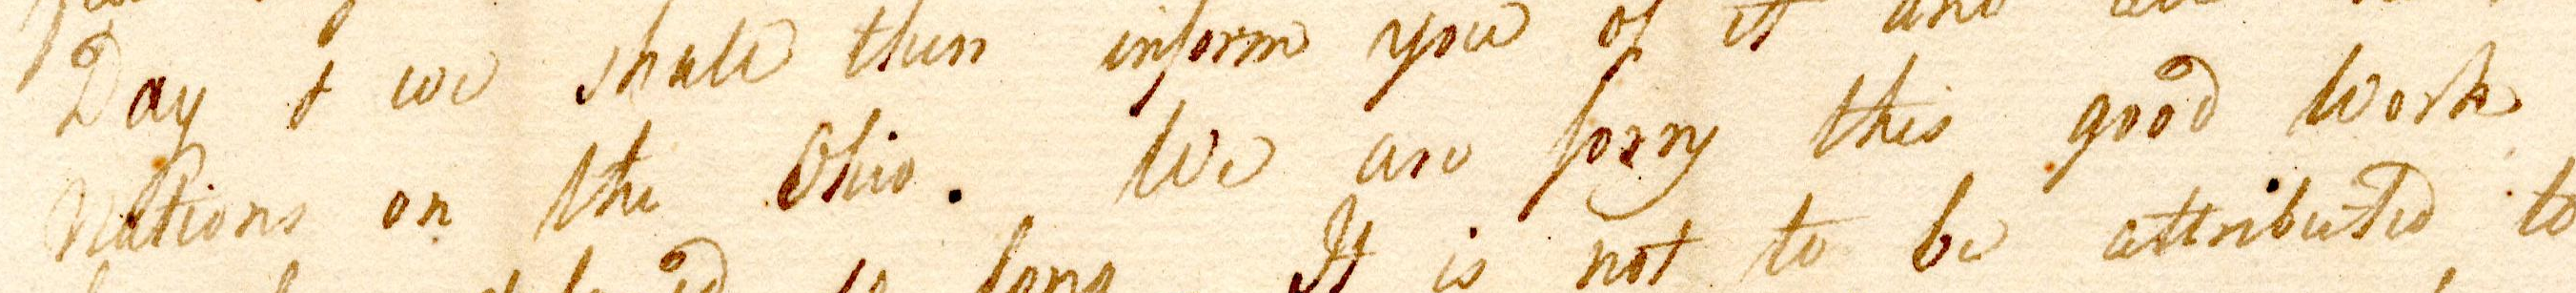Nations on the Ohio. We are sorry this good work
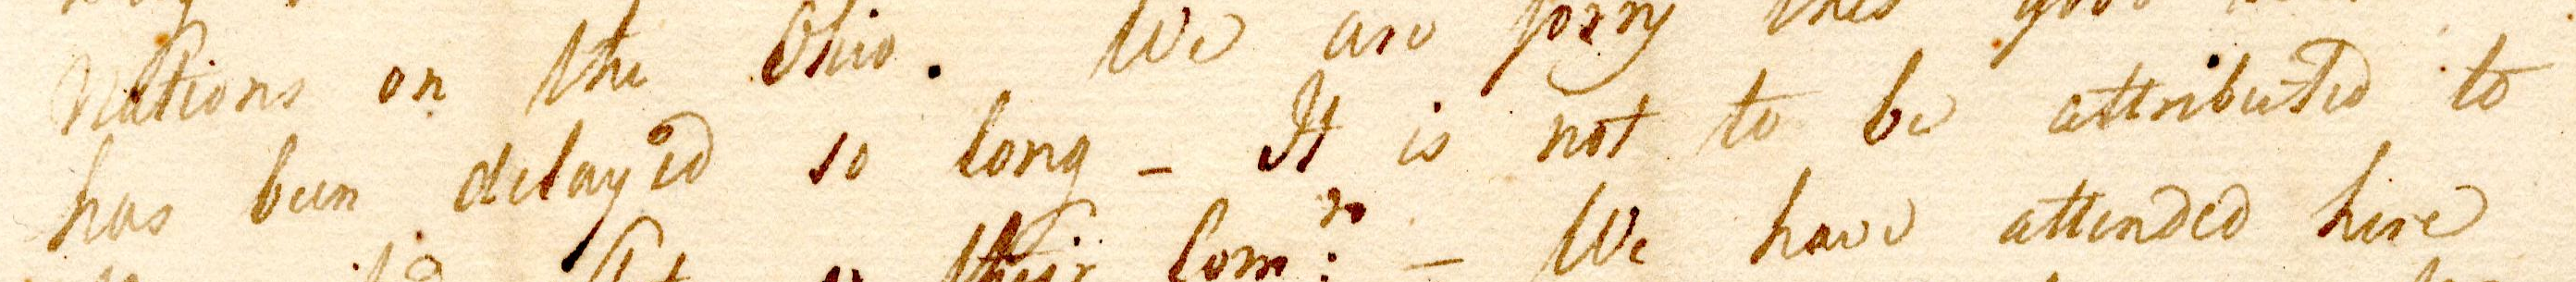has been delayed so long- It is not to be attributed to
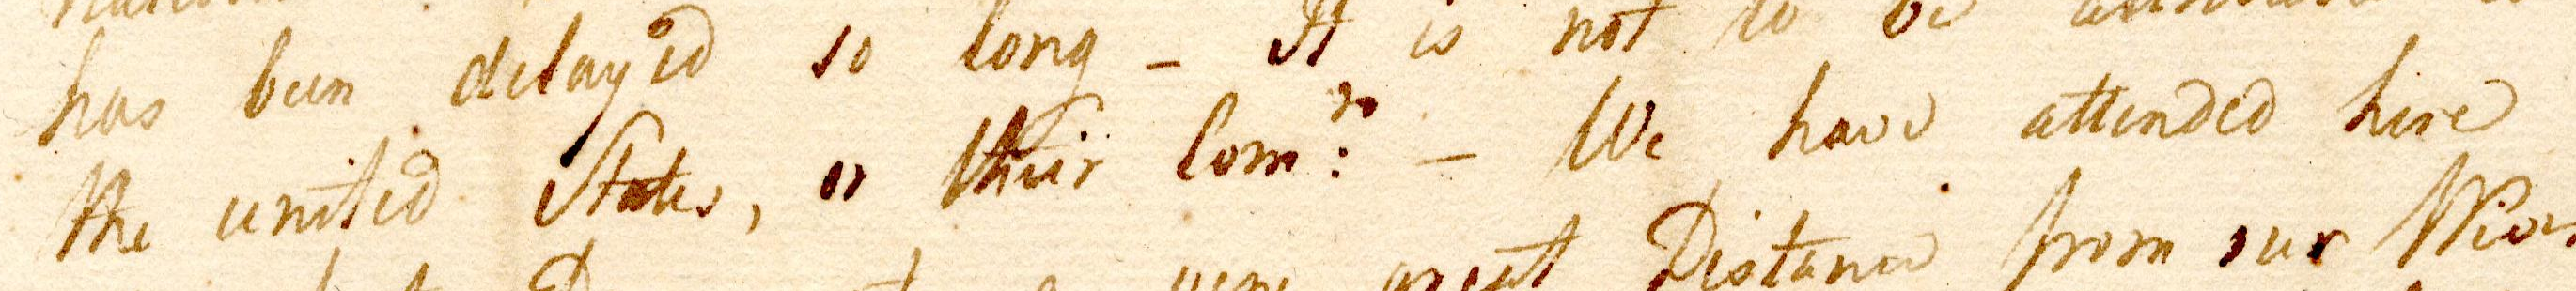the united States, or their Com^r:- We have attended here
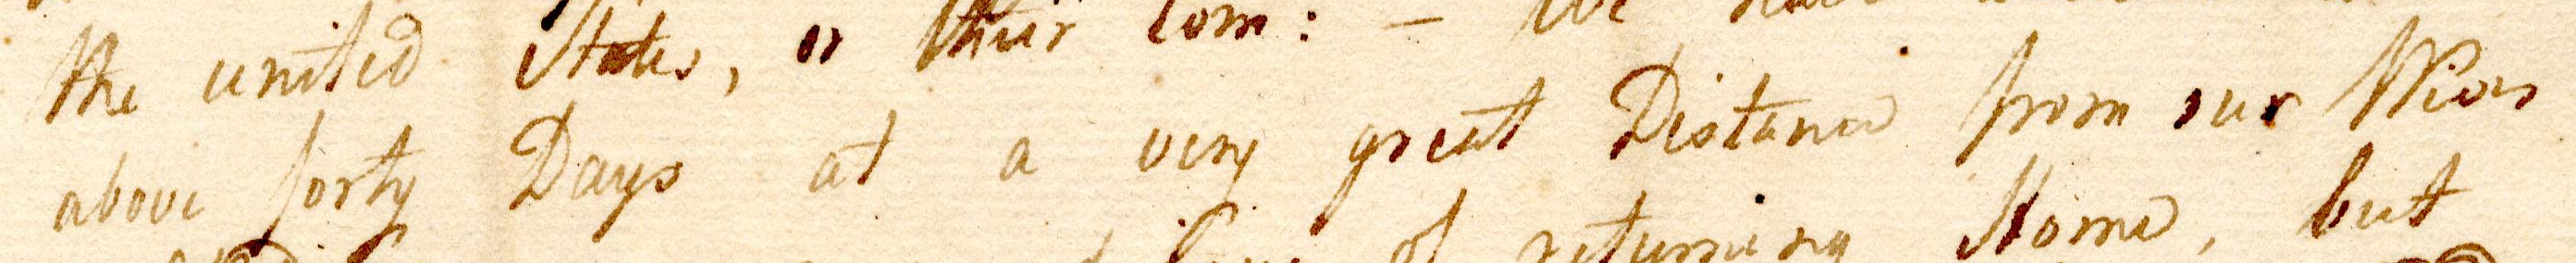above forty Days at a very great Distance from our Wives
